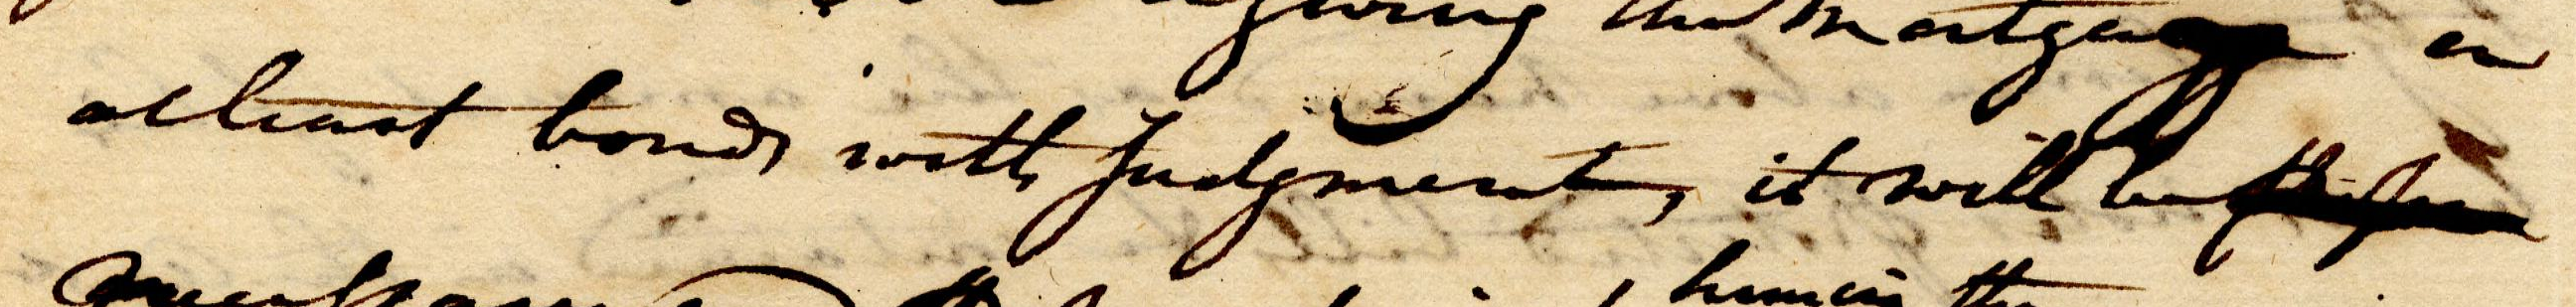at least bonds with judgments, it will be [_______]
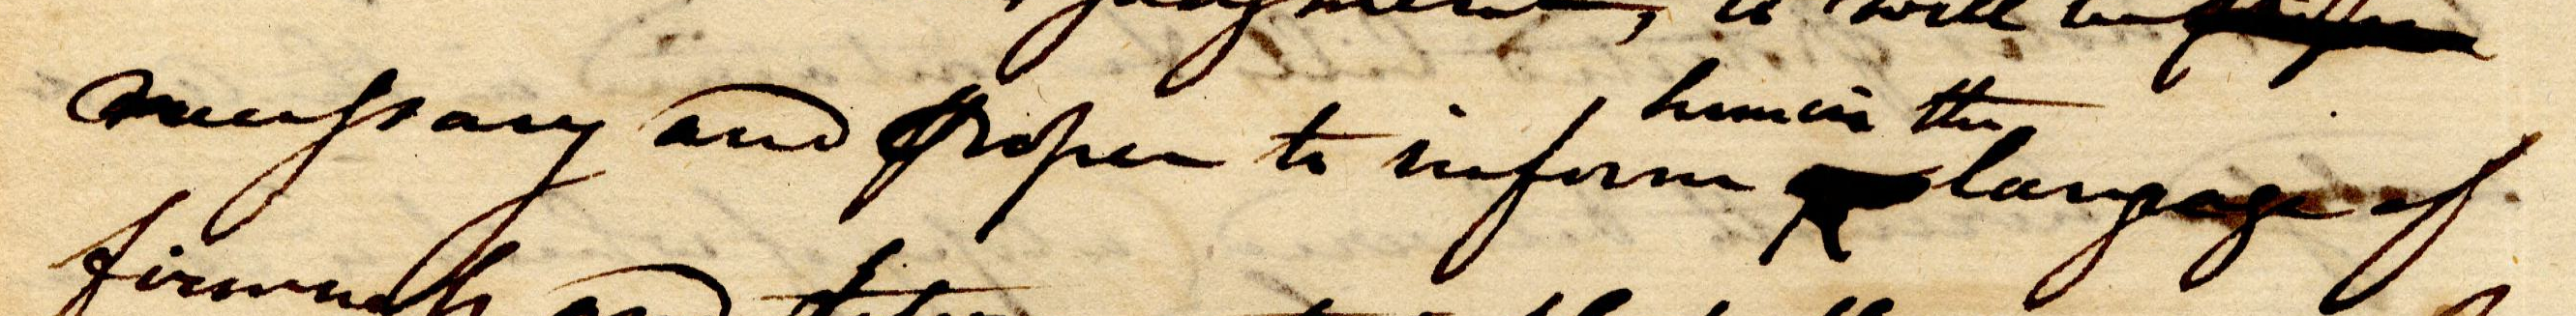necessary and proper to inform ^ language of
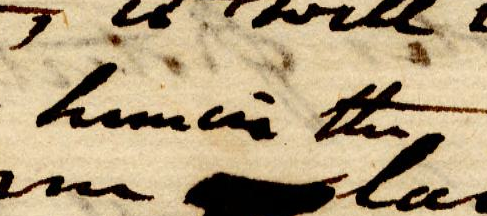him in the
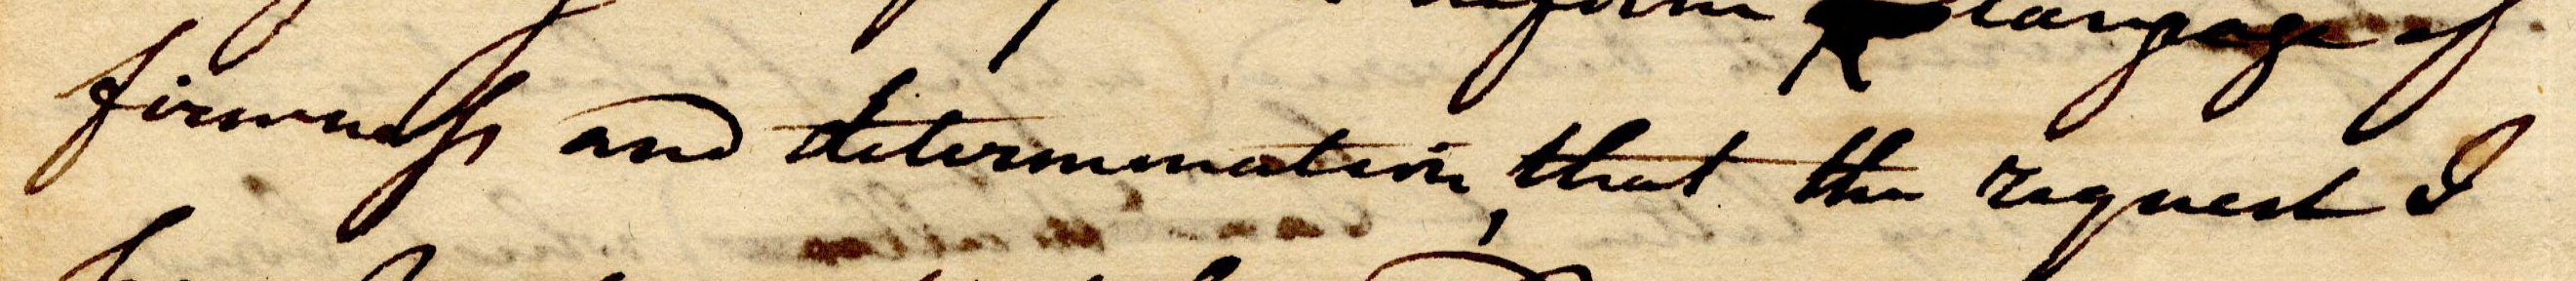firmness and determination, that the request I
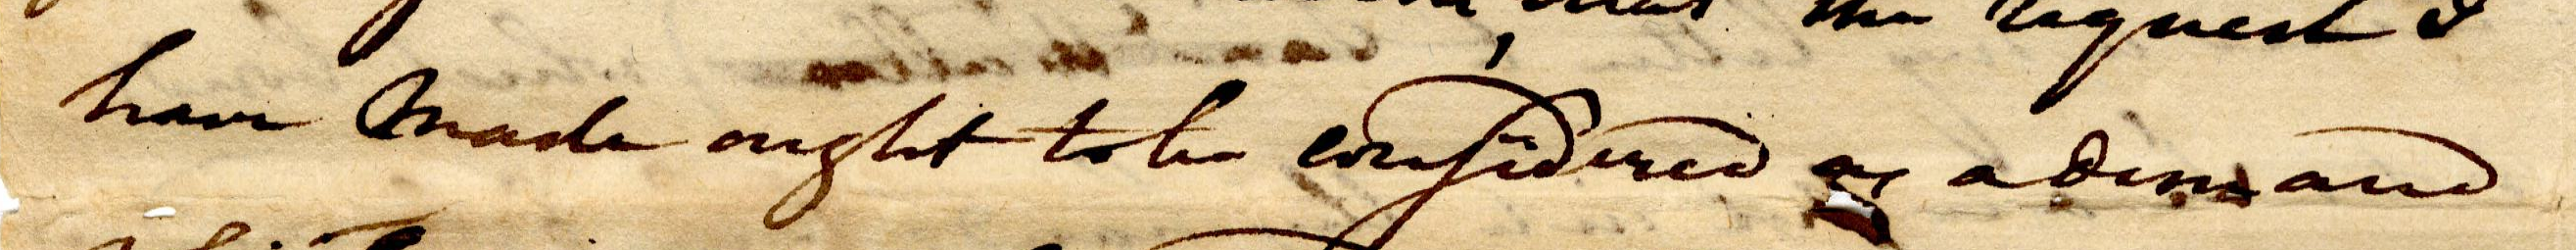have made ought to be considered as a demand
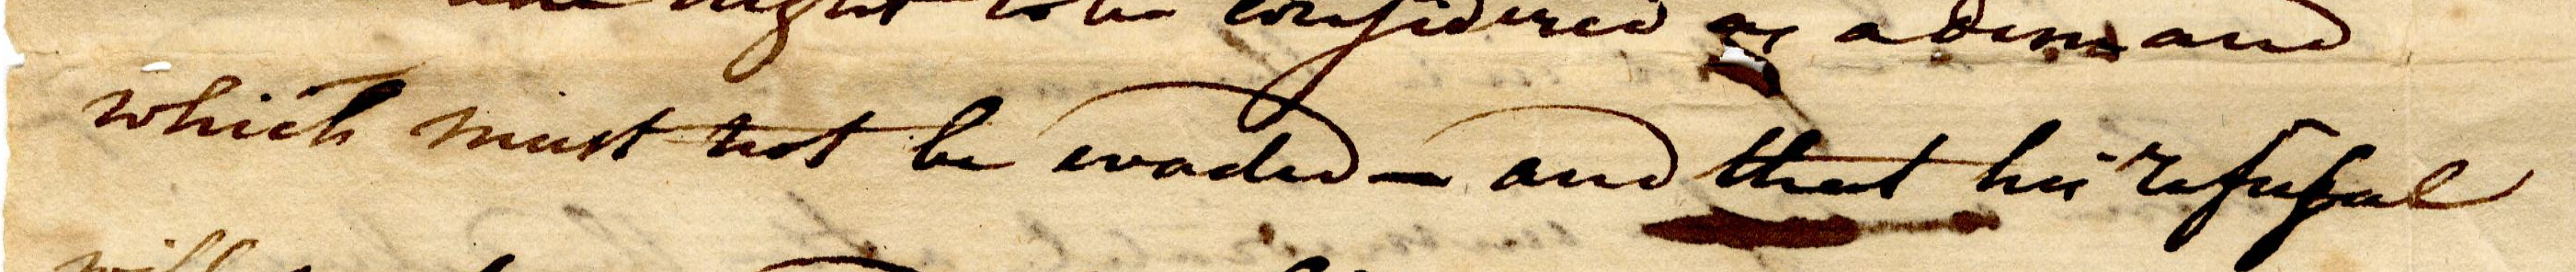which must not be evaded- and that his refusal
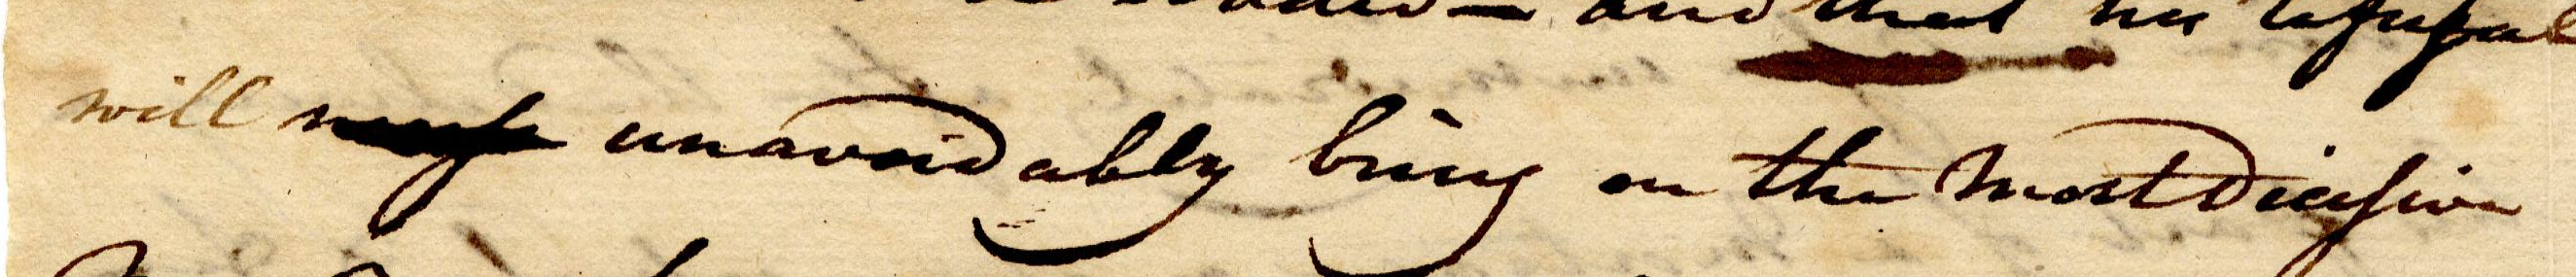will [_____] unavoidably bring on the most decisive
